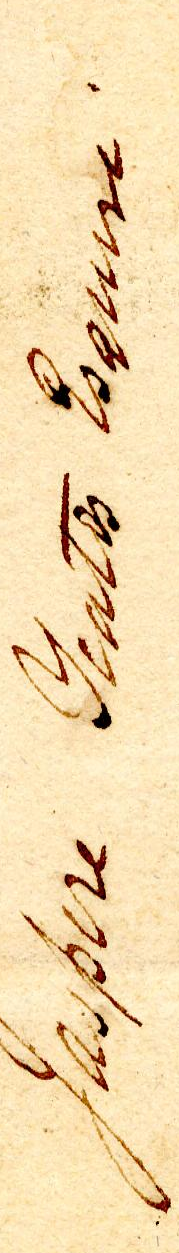Jaspere Yeates Esquire
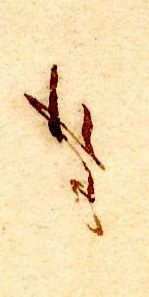at
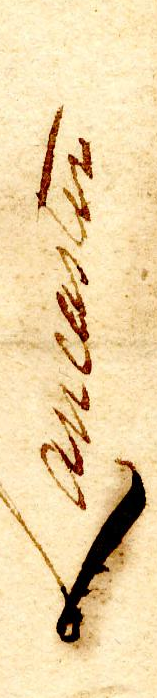Lancaster
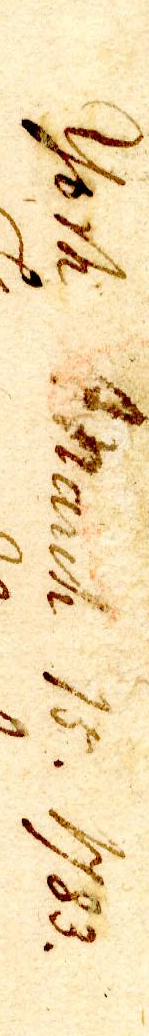York March 15. 1783.
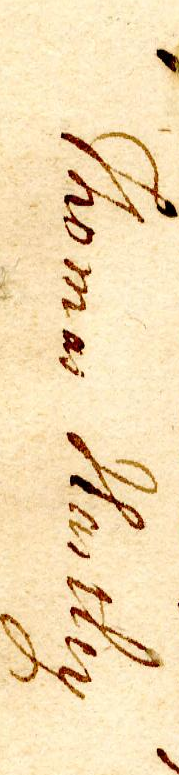Thomas Hartley
